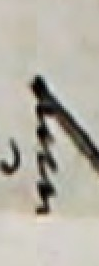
ung
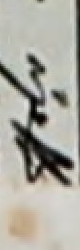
Hnr
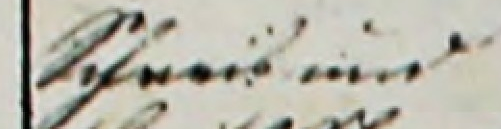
Schreib und
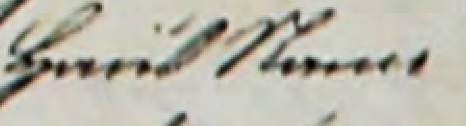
Haus Name
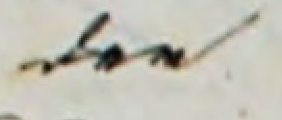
der
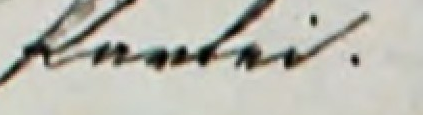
Partei.
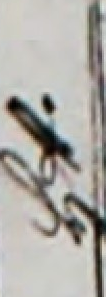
HH.
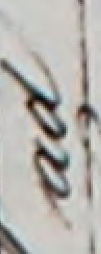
ad
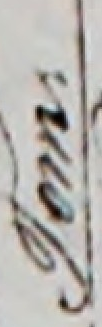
Tom
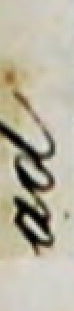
ad
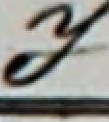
J.
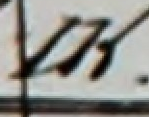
Ck.
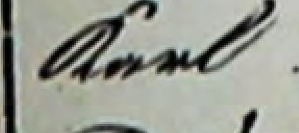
Karl
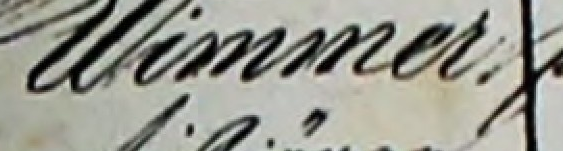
Wimmer
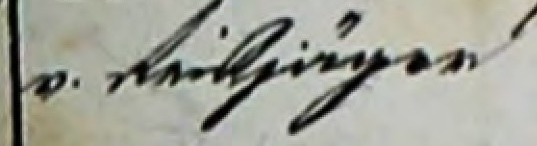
v. Reisjäger
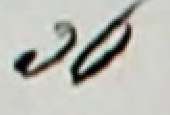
36
